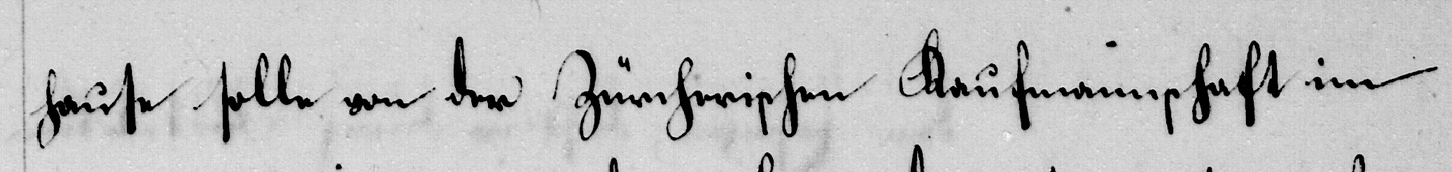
hause solle von der Zürcherischen Kaufmannschaft im
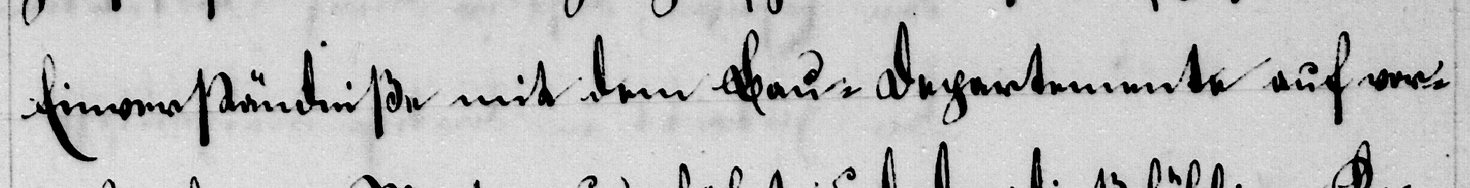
Einverständniße mit dem Bau-Departemente auf vor¬
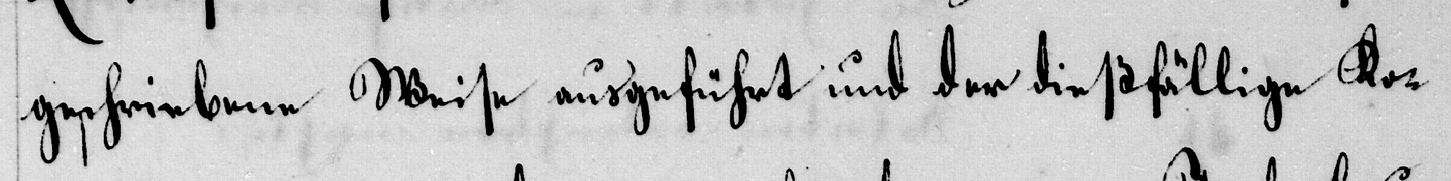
geschriebene Weise ausgeführt und der dießfällige Ko¬
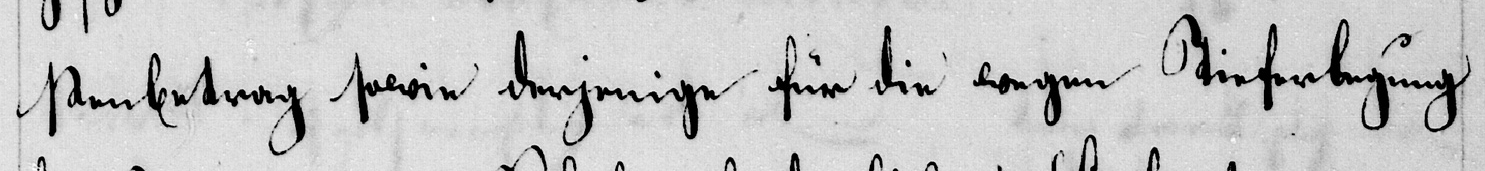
stenbetrag sowie derjenige für die wegen Tieferlegung
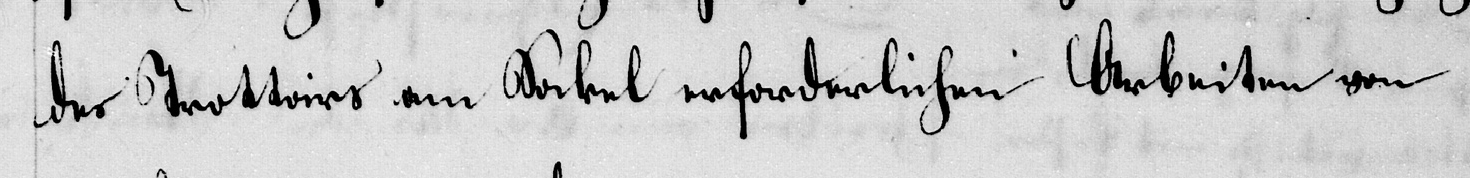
des Trottoirs am Sockel erforderlichen Arbeiten von
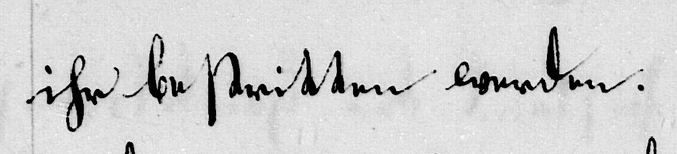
ihr bestritten werden.
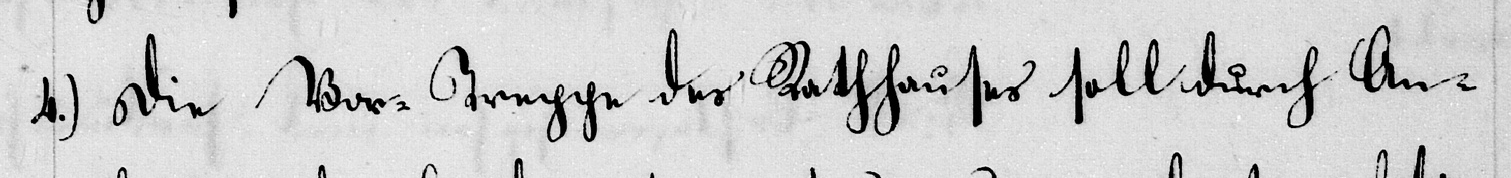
4.) Die Vor-Treppe des Rathhauses soll durch An¬
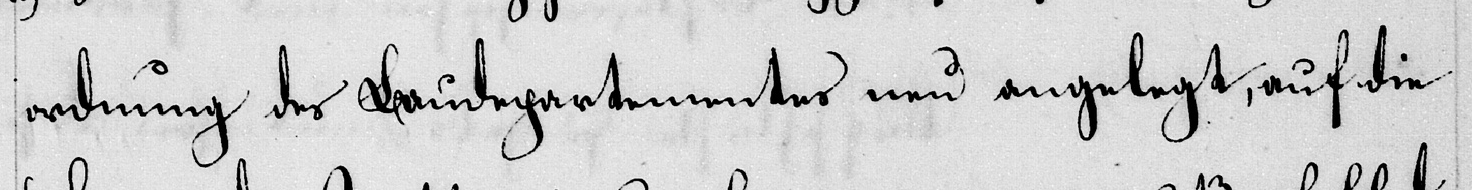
ordnung des Baudepartementes neu angelegt, auf die
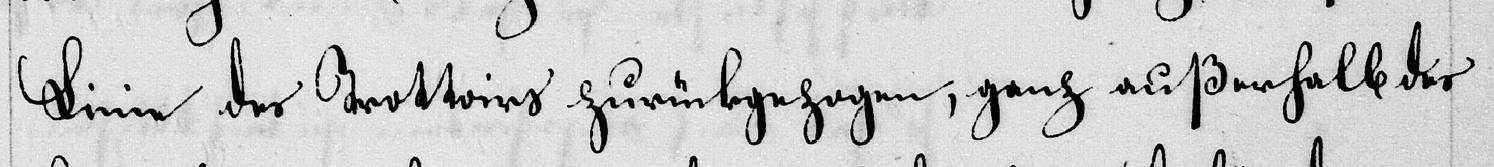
Linie des Trottoirs zurückgezogen, ganz außerhalb des
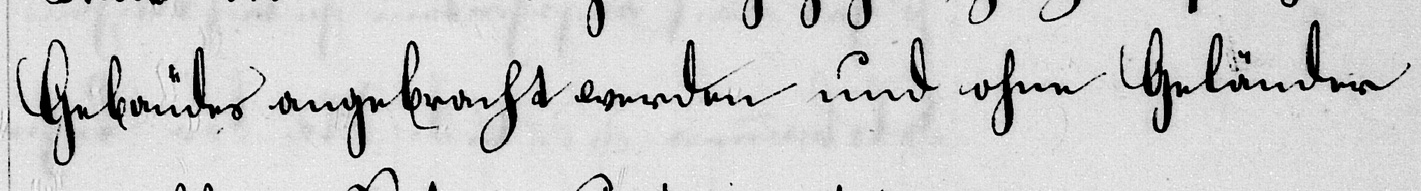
Gebäudes angebracht werden und ohne Geländer
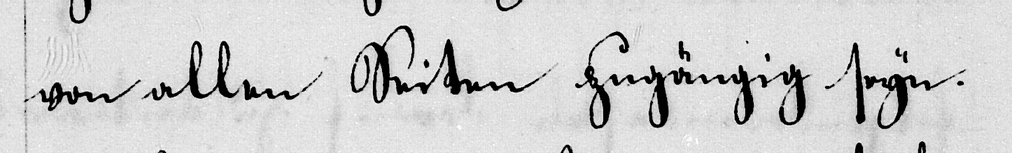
von allen Seiten zugängig seyn.
